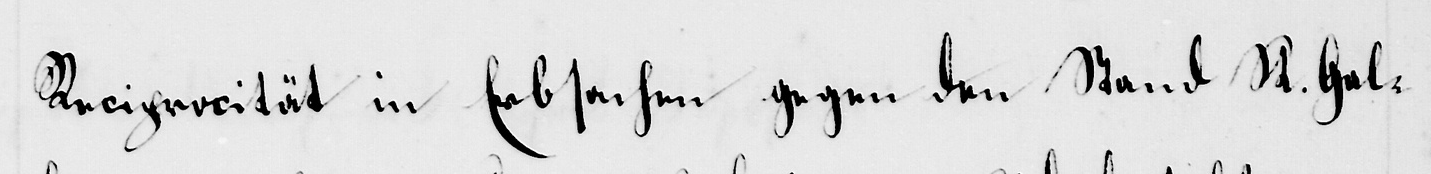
Reciprocität in Erbsachen gegen den Stand St. Gal¬
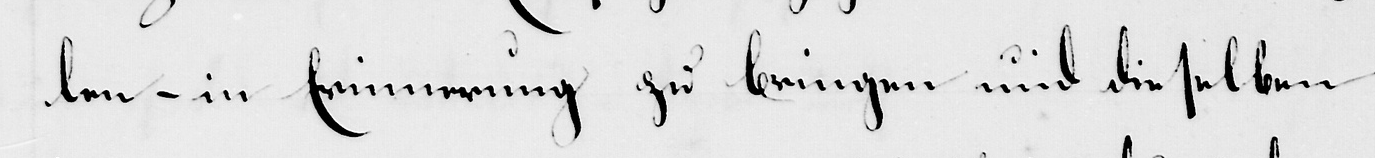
len – in Erinnerung zu bringen und dieselben
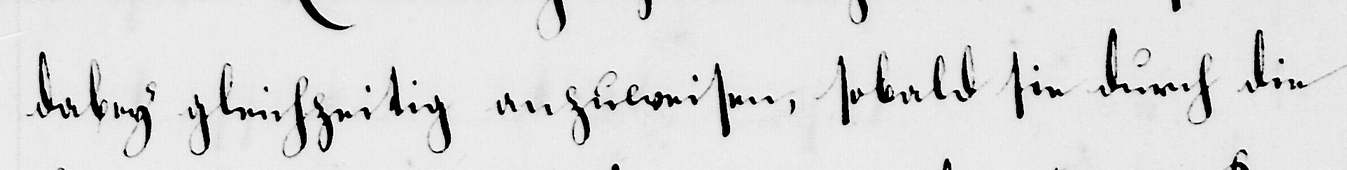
dabey gleichzeitig anzuweisen, sobald sie durch die
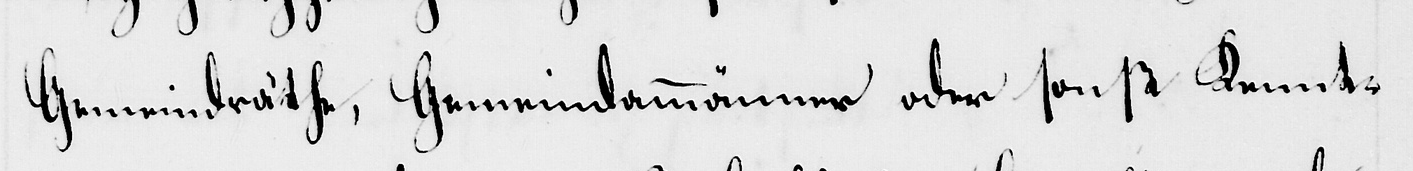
Gemeindräthe, Gemeindammänner oder sonst Kennt¬
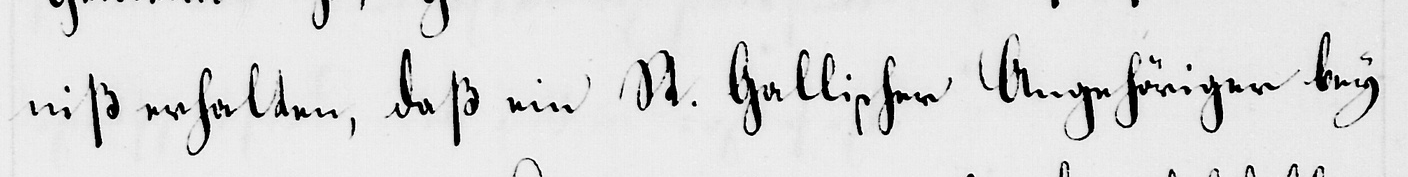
niß erhalten, daß ein St. Gallischer Angehöriger bey
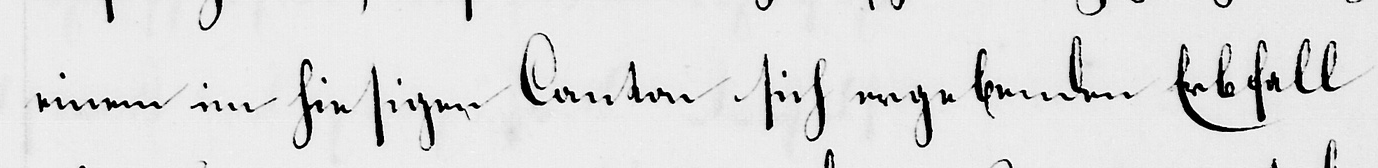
einem im hiesigem Canton sich ergebenden Erbfall
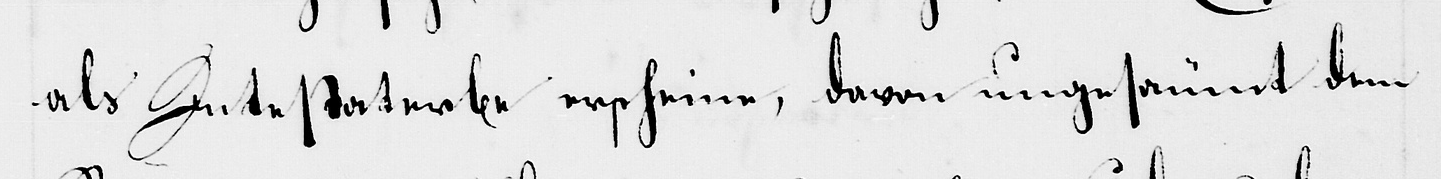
als Intestaterbe erscheine, davon ungesäumt dem
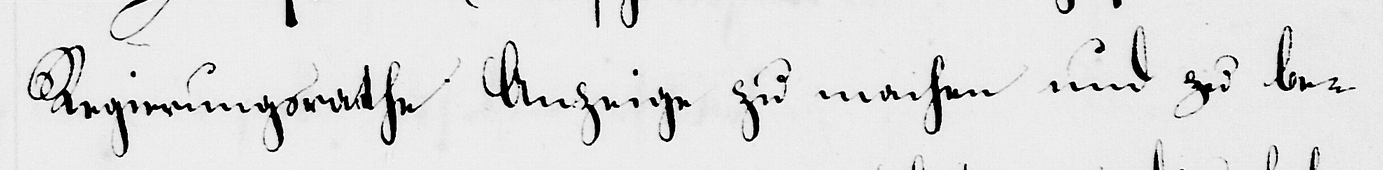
Regierungsrathe Anzeige zu machen und zu be¬
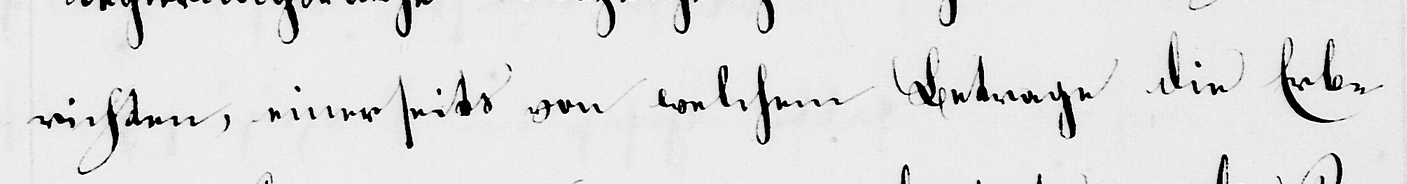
richten, einerseits von welchem Betrage die Erb¬
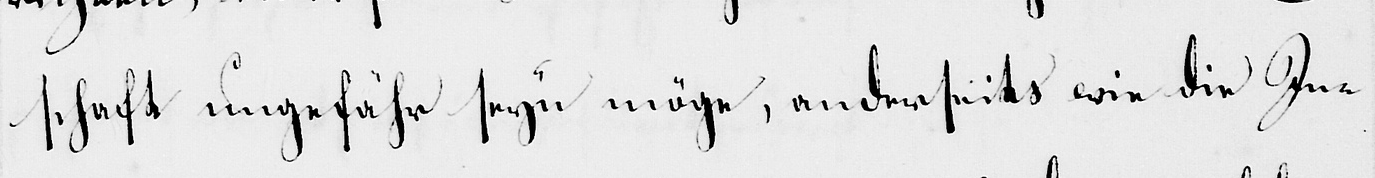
schaft ungefähr seyn möge, anderseits wie die In¬
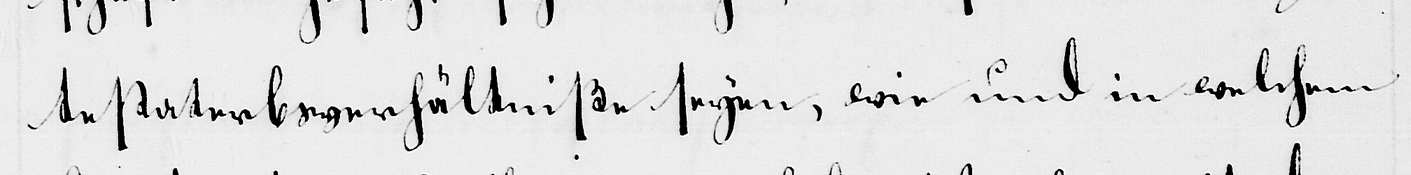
testaterbverhältniße seyen, wie und in welchem
